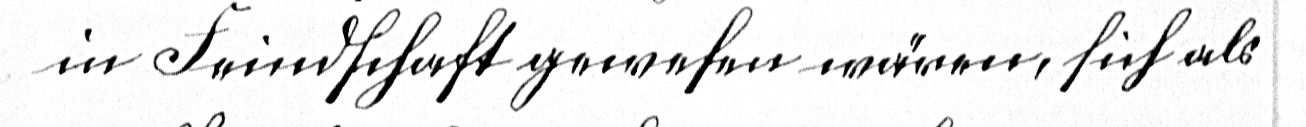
in Feindschaft gewesen wären, sich als
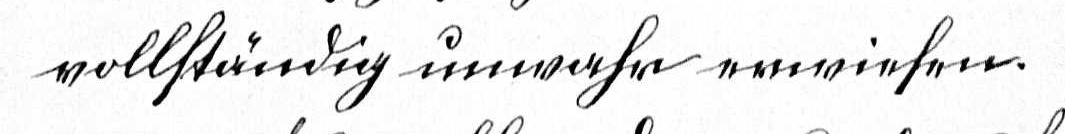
vollstädig unwahr erwiesen.
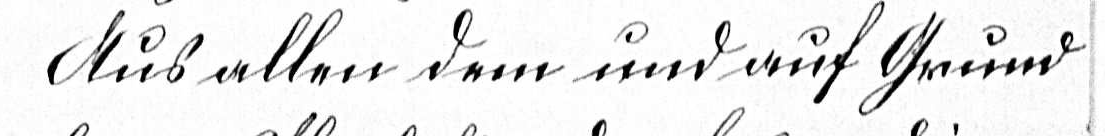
Aus allen dem und auf Grund
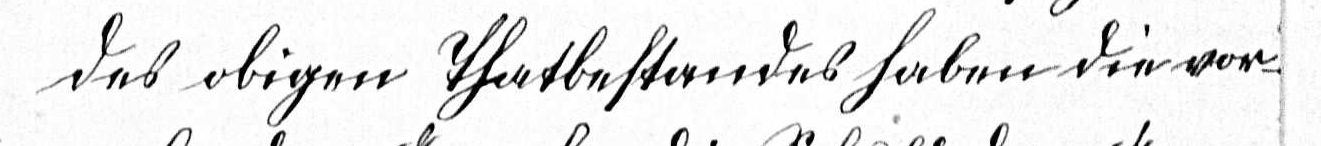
des obige Thatbestandes haben die vor¬
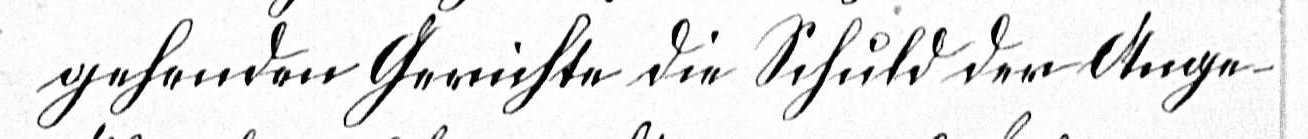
gehenden Gerichte die Schuld der Ange¬
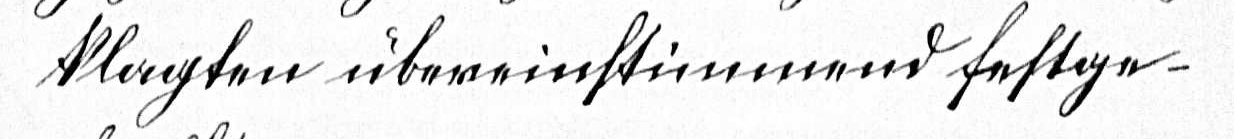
klagten übereinstimmend festge¬
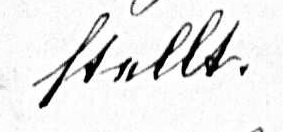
stellt.
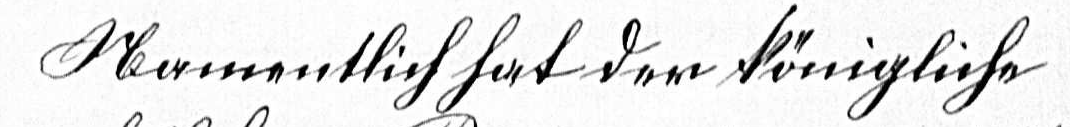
Namentlich hat der königliche
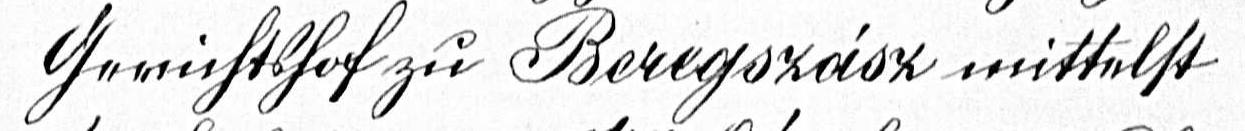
Gerichtshof zu Beregszász mittelst
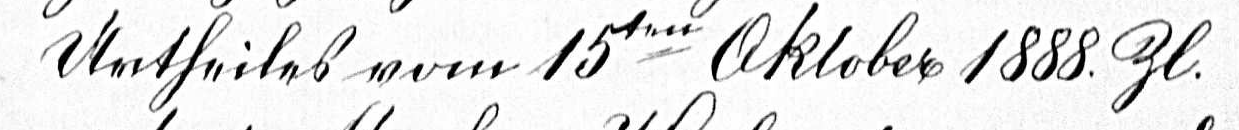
Urtheiles vom 15ten Oktober 1888. Zl.
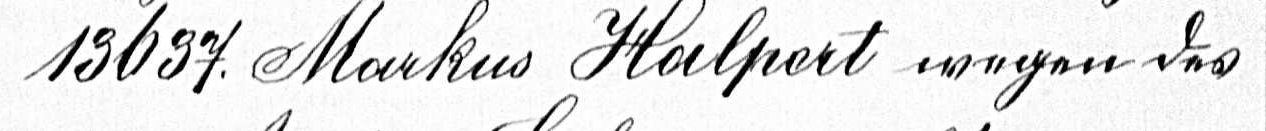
13637. Markus Halpert wegen des
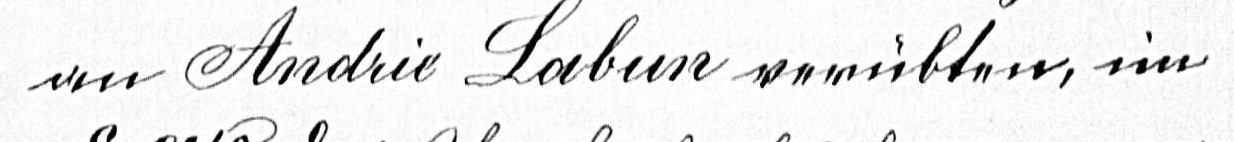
an Andrie Labun verübten, im
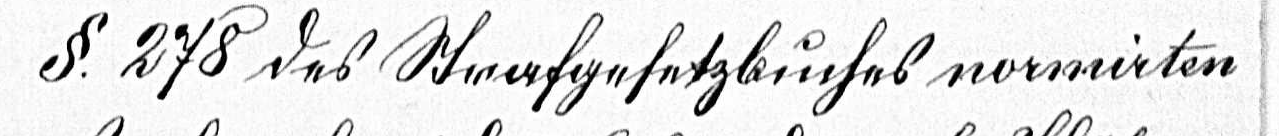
§. 278 des Strafgesetzbuches normirten
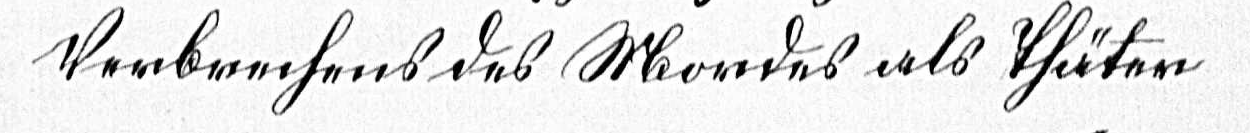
Verbrechens des Mordes als Thäter
